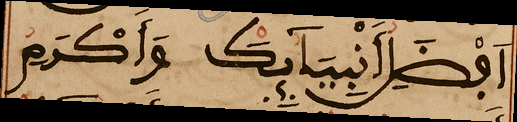وافضل أنبيائك وأكرم
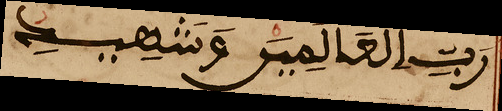رب العالمين وشهيد
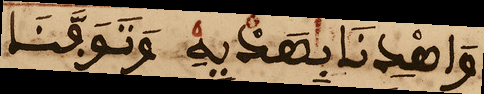واهدنا بهديه وتوفنا
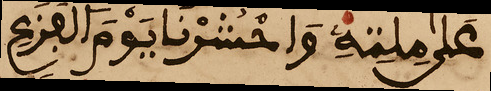على ملته واحشرنا يوم الفزع
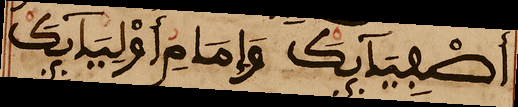أصفيآئك إمام أوليآئك
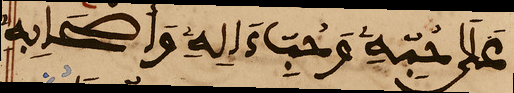على حبه وحب ءاله وأصحابه
